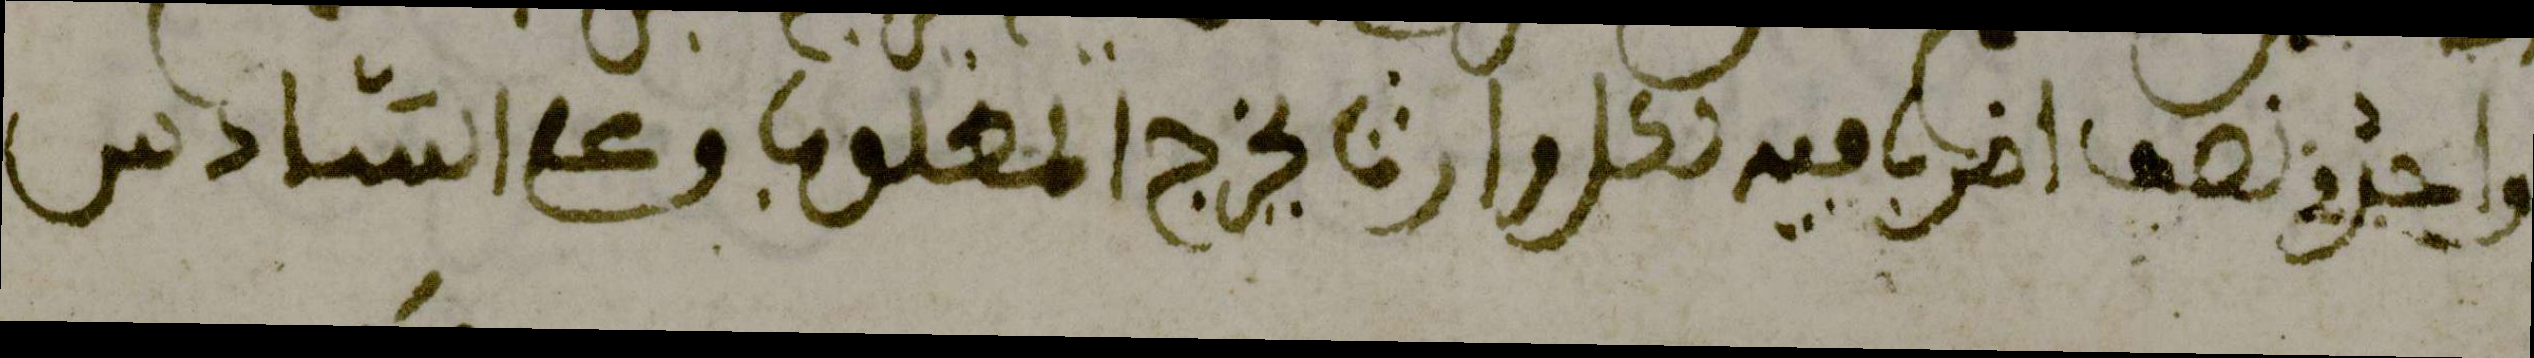واحدد ونصف اضرب فيه لكل وارث يخرج المطلوب وعلى السَّادس
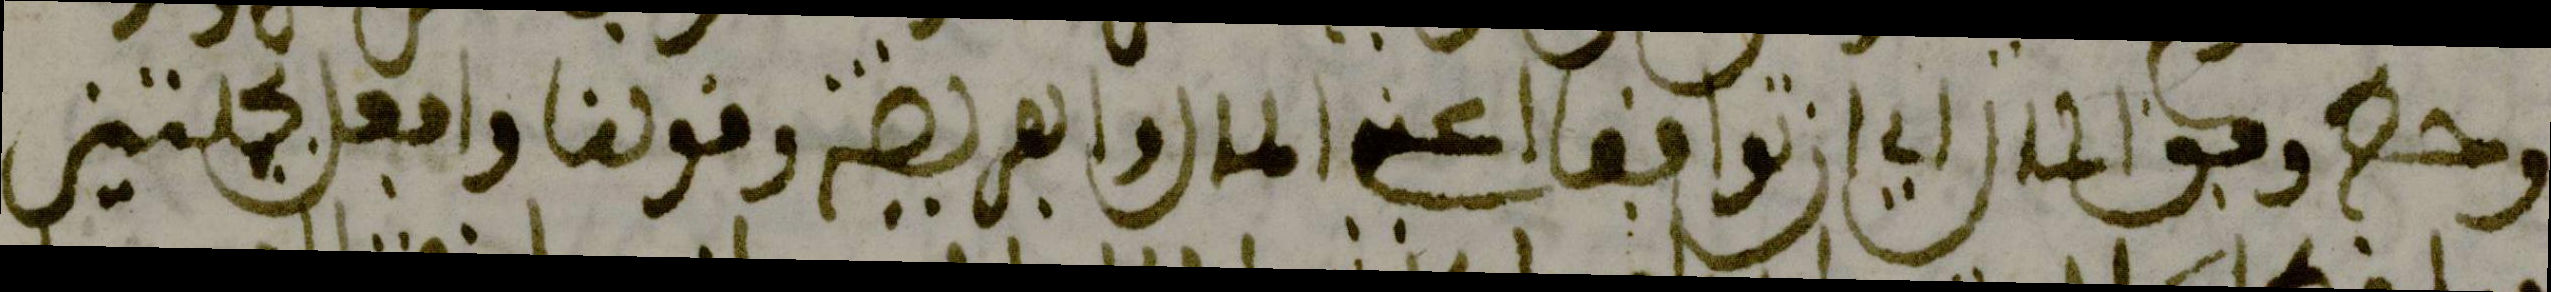وحذ وفق المال اي ان توافقا اعني المال والفريضة وقولنا وافعل بجملتين
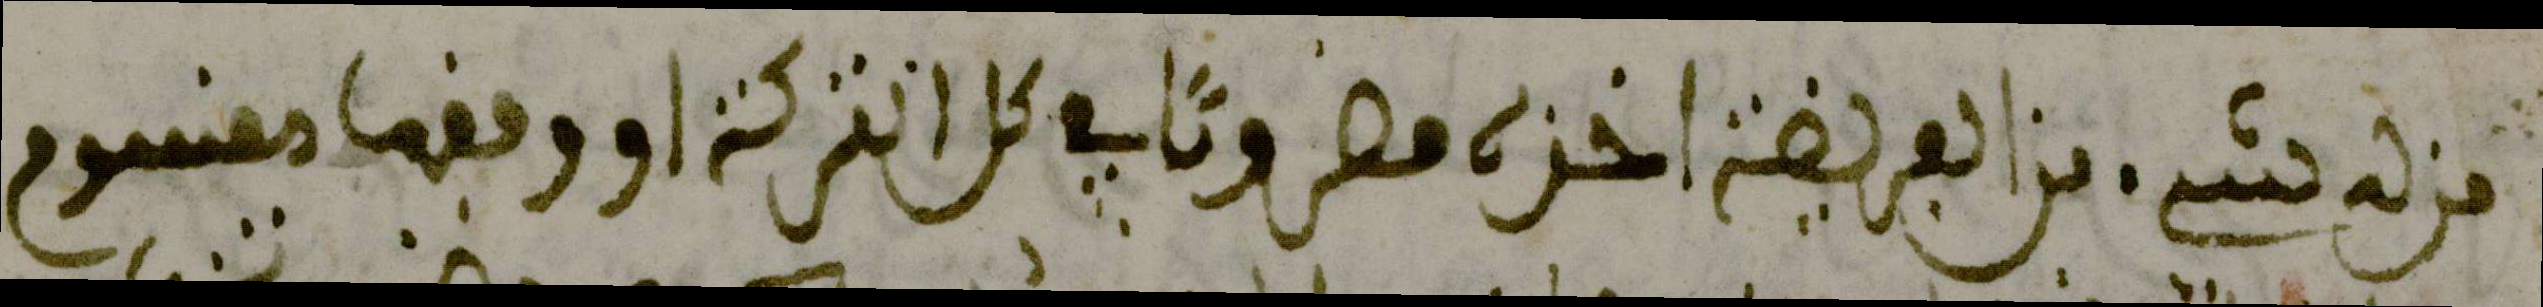من له شيء من الفريضة اخذه مضروبًا في كل التركة او وفقها مقسوم
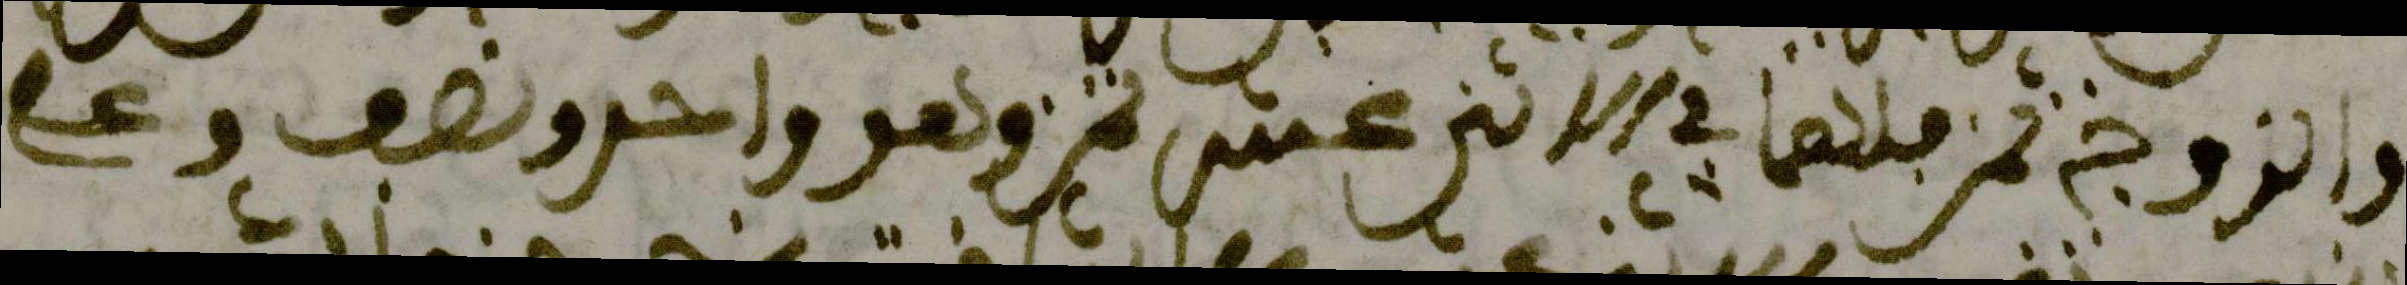والزوجة ثمن فلها في الاثنى عشر ثمن وهو واحد ونصف وعلى
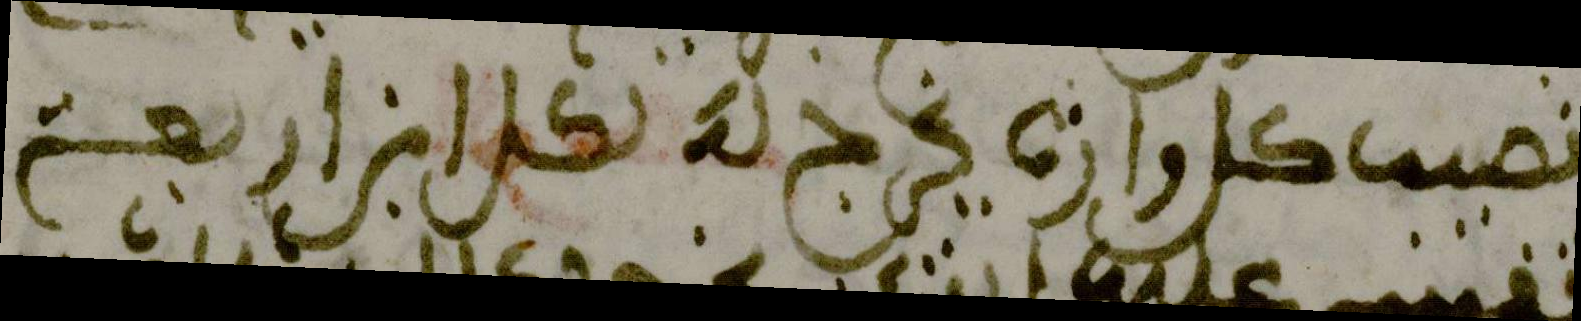نصيب كل وارث يخرج له لكل ابن اربعة
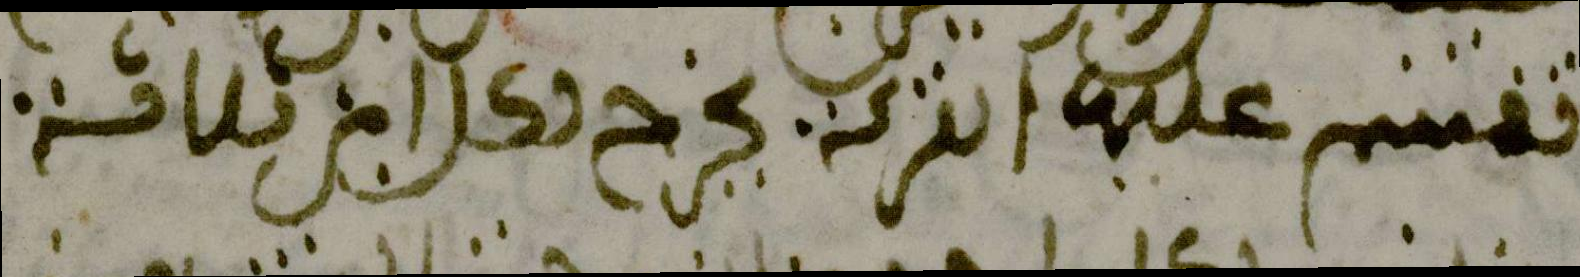تقسم عليها التركة يخرج لكل ابن ثلاثة
